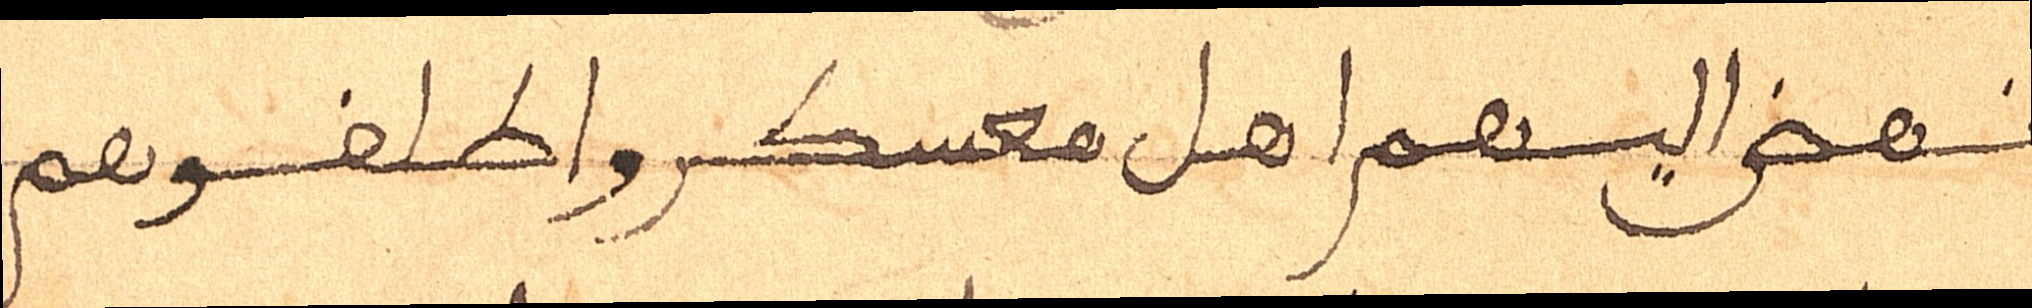نهض اليهم اهل معسكر واطلقوهم
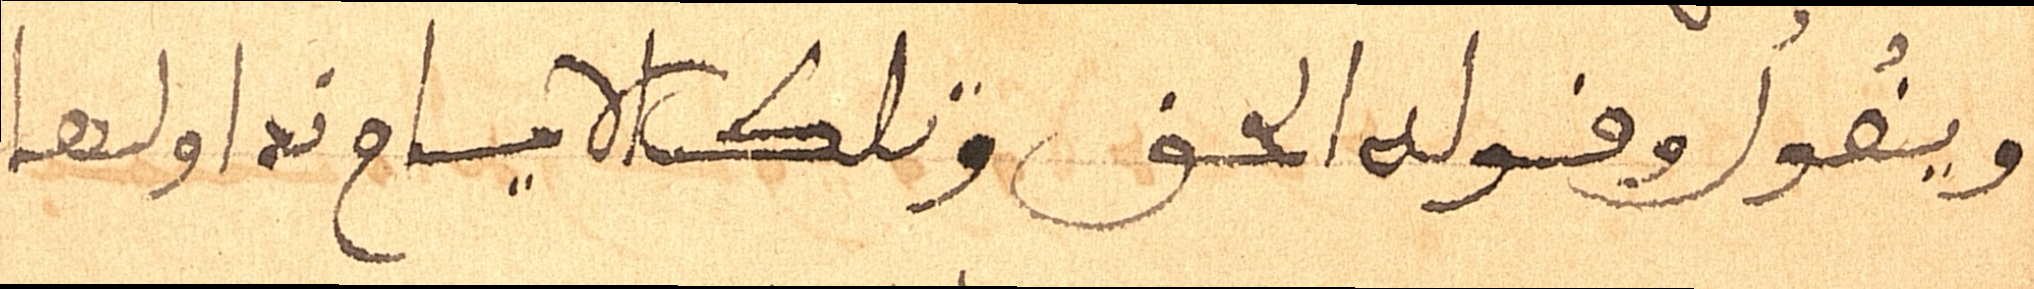ويقول وقوله الحق وتلك الايام ندا ولها
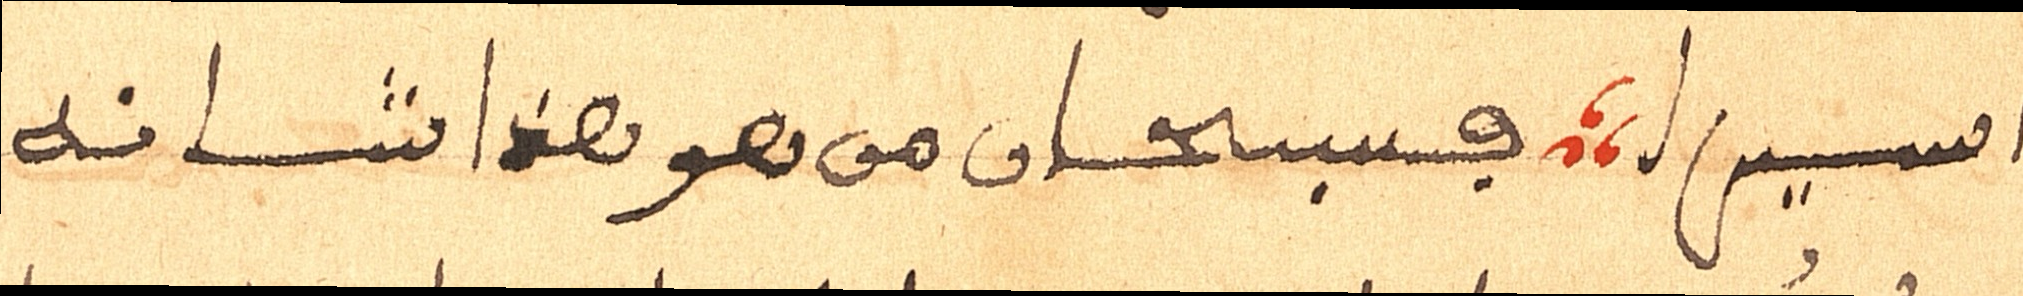اسيرا فسبحان من هو هذا شانه
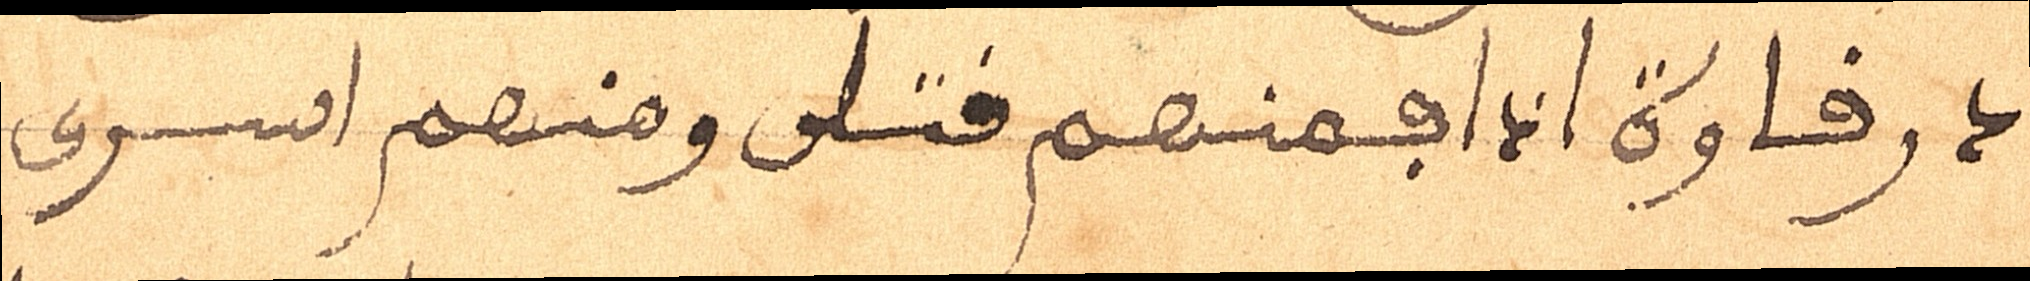درقاوة اذا فمنهم قتلى ومنهم اسرى
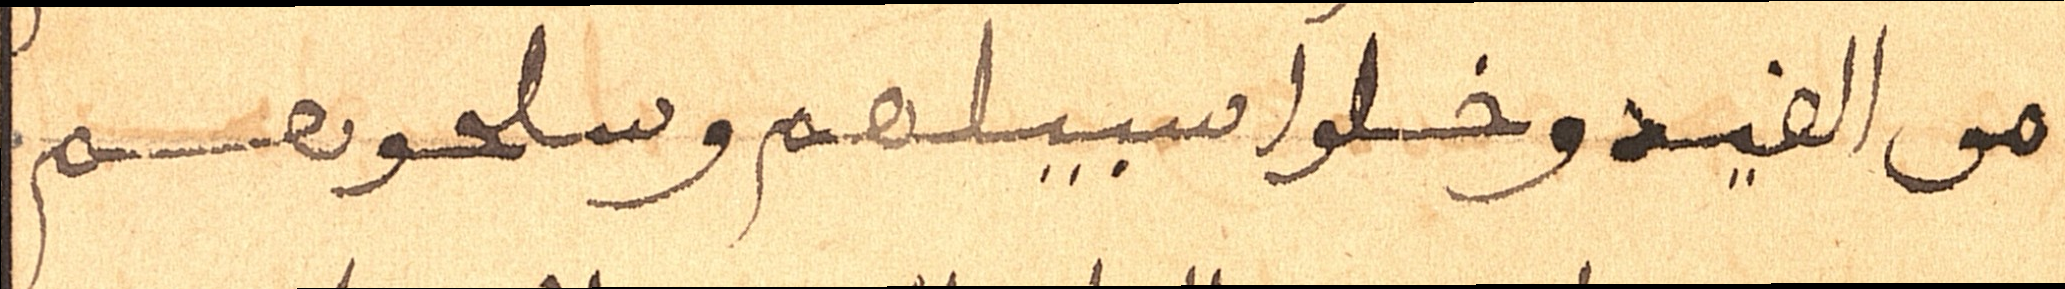من القيد وخلوا سبيلهم وسلحوهم
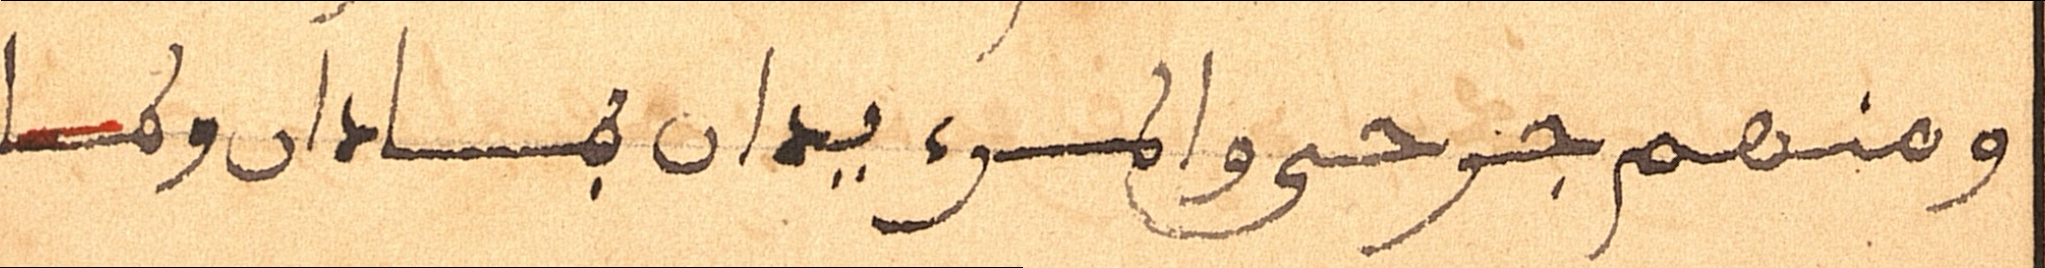ومنهم جرحى والمرء يدان بمادان ولما
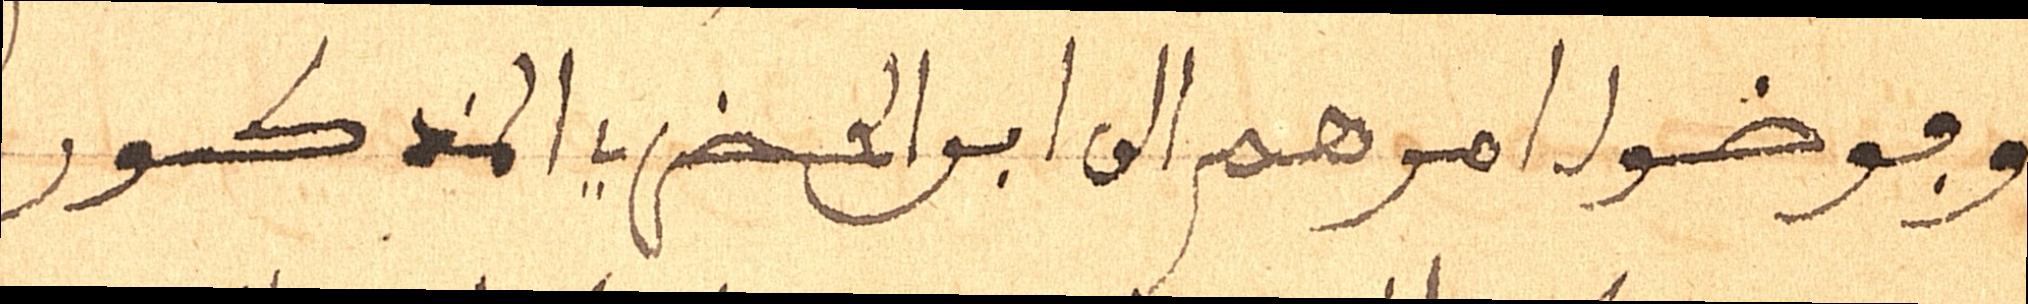وفوضوا امرهم الى ابن الحضري المذكور
